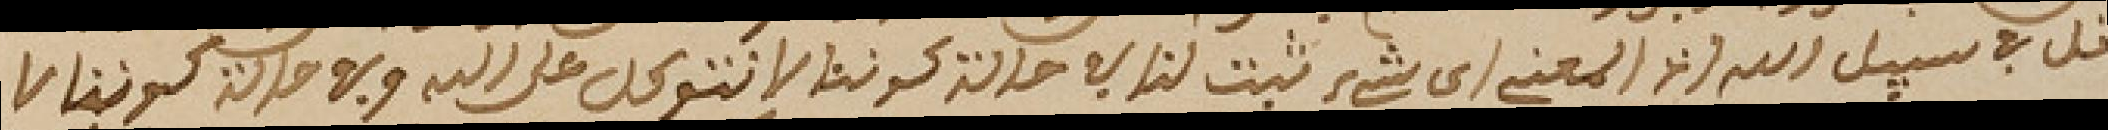تل في سبيل الله اذ المعنى أي شيء ثبت لنا في حالة كوننا لا نتوكل على الله وفي حالة كوننا لا
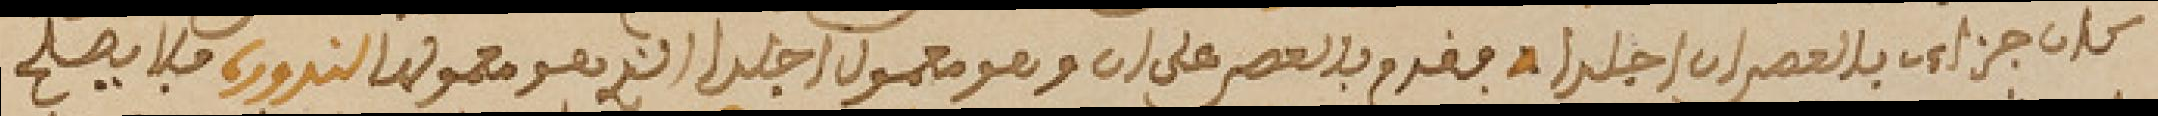كان جزاءي بالعصى ان اجلدا فقدم بالعصى على ان وهو معمول اجلدا الذي هو معمولها الندوره فلا يصلح
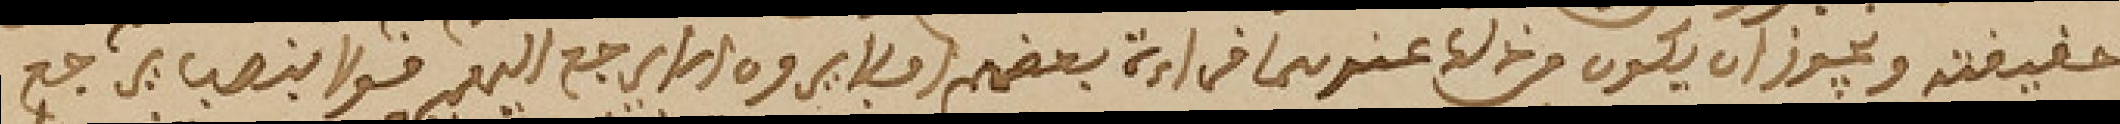حقيقته ويجوز ان يكون من ذلك عندهما قراءة بعضهم افلا يرون الا يرجع اليهم قولا بنصب يرجع
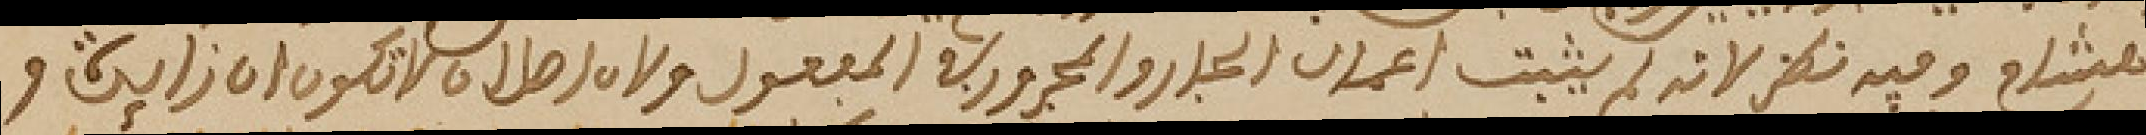هشام وفيه نظر لانه لم يثبت اعمال الجار والمجرور في المفعول ولان اصل ان لا تكون ان زائدة و
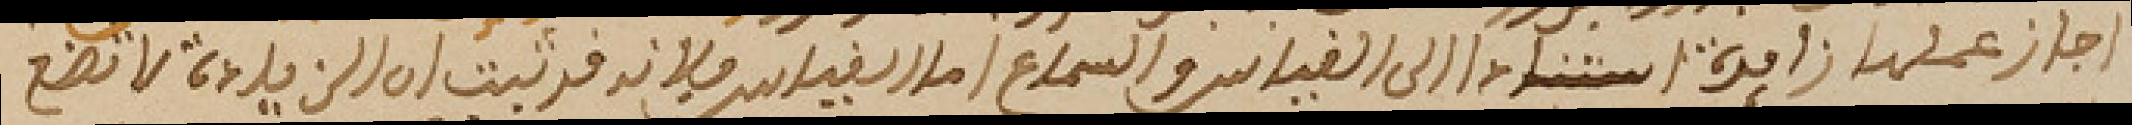أجاز عملها زائدة استنادا الى القياس والسماع اما القياس فلانه قد ثبت ان الزياة لا تضع
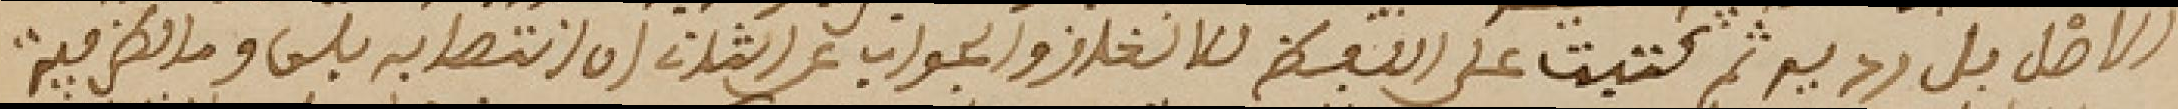الأصل بل رديه ثم كتبت على اللفظ للالغاز والجواب عن الثاني ان انتصابه بلى وما الظرفية
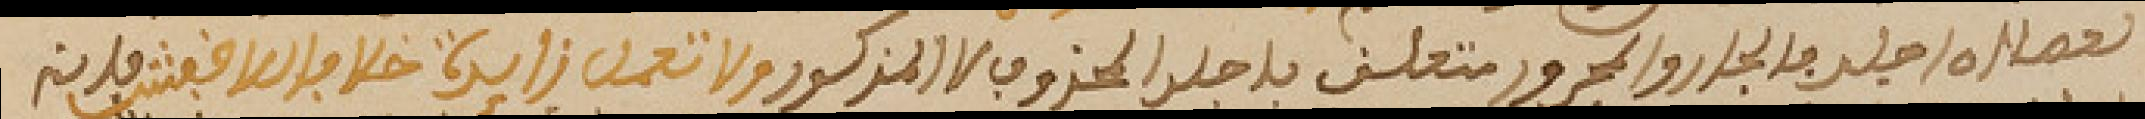لعصا ان اجلد فالجار والمجرور متعلق باجلد المحذوف لا المذكور ولا تعمل زائدة خلافا للاخفش فانه
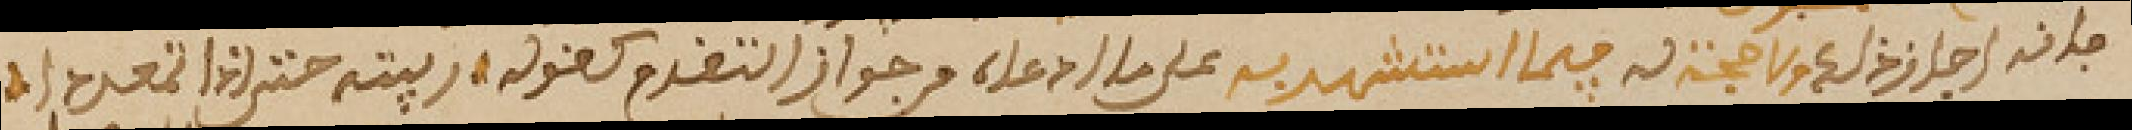فانه أجاز ذلك ولا حجة له فيما استشهد به على ما ادعاه وجواز التقدم كقوله ربيته حتى اذا تمعددا
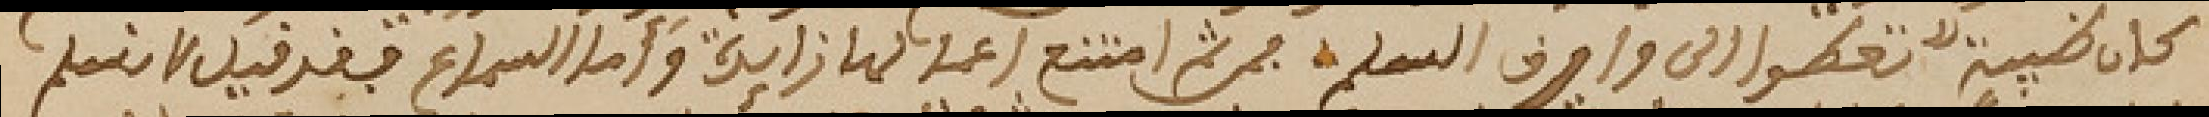كان ظبية تعطو الى وارق السلم فمن ثم امتنع اعمالها زائدة واما السماع فقد قيل لا نسلم
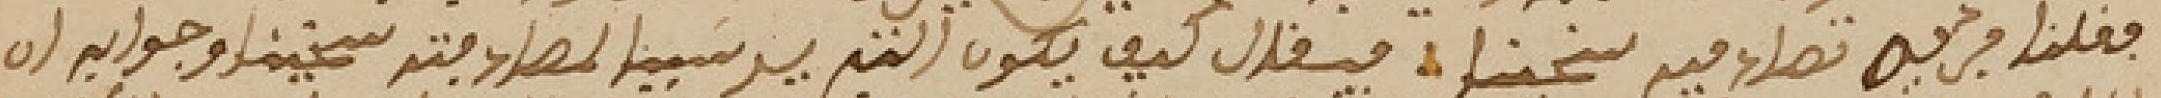فقلنا برديه تصادفيه سخينا فيقال كيف يكون التبريد سببا لمصادفته سخينا وجوابه ان
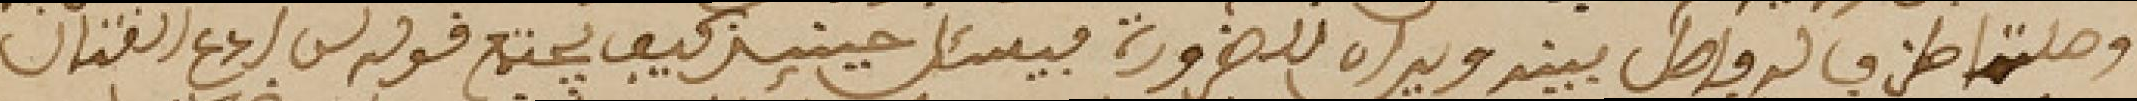وصلتما ظرف له فاصل بينه وبين ان للضرورة فيسئل حينئذ كيف يجتمع قوله لي ادع القتال
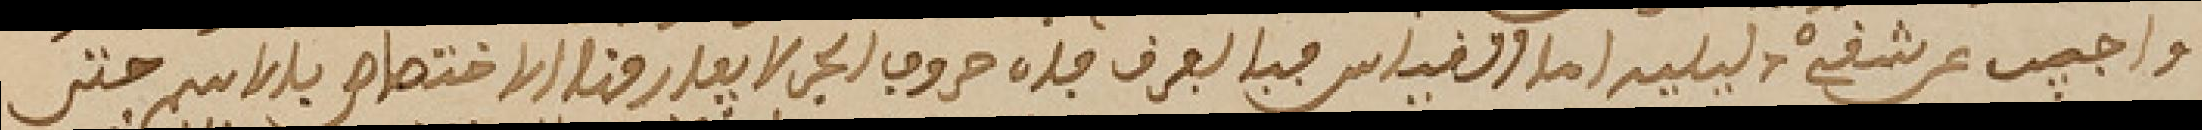واجيب عن شقي دليليه اما القياس فبالفرق فان حروف الجر لا يفارقها الاختصاص بالاسم حتى
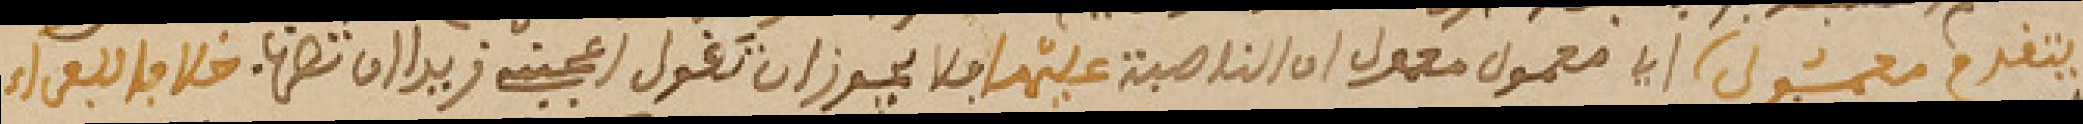يتقدم معمول أي معمول معمول ان الناصبة عليها يجوز ان تقول اعجبني زيدا ان تضرب خلافا للفراء
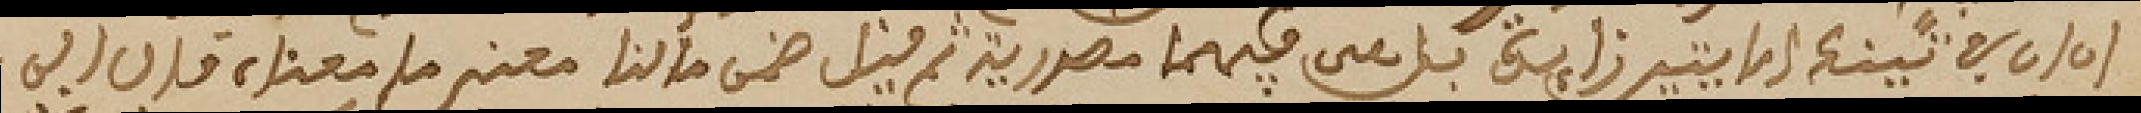ان ان في تينك الآيتين زائدة بل هي فيهما مصدرية ثم قيل ضمن مالنا معنى مامعناه قال ابن
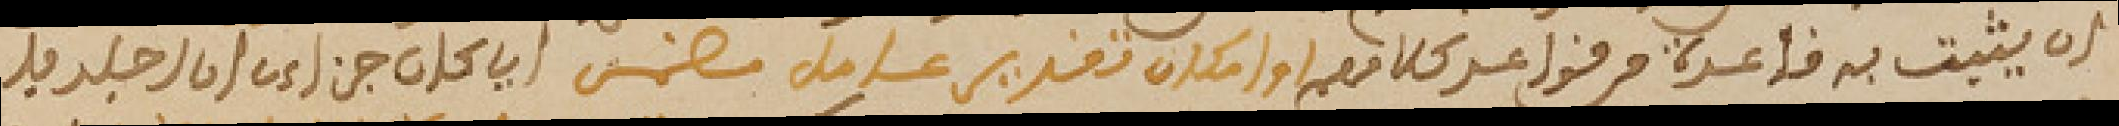ان يثبت به قاعدة وقواعد كلامهم وامكان تقرير عامل مضمر اي كان جزاءي ان اجلدا فا
